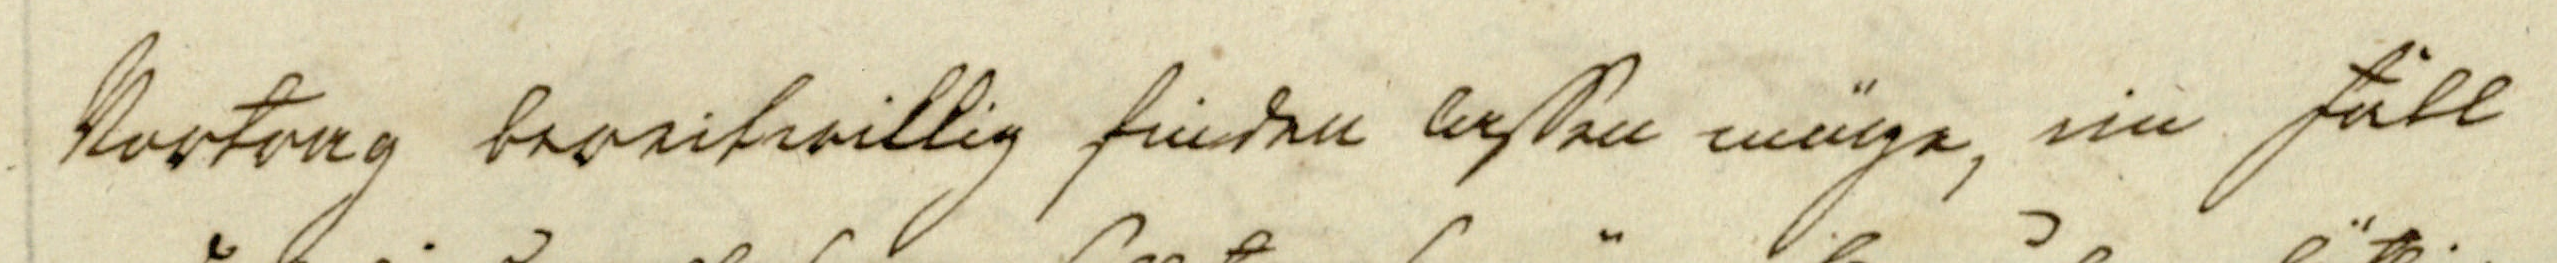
Vortrag bereitwillig finden lassen möge, im Fall
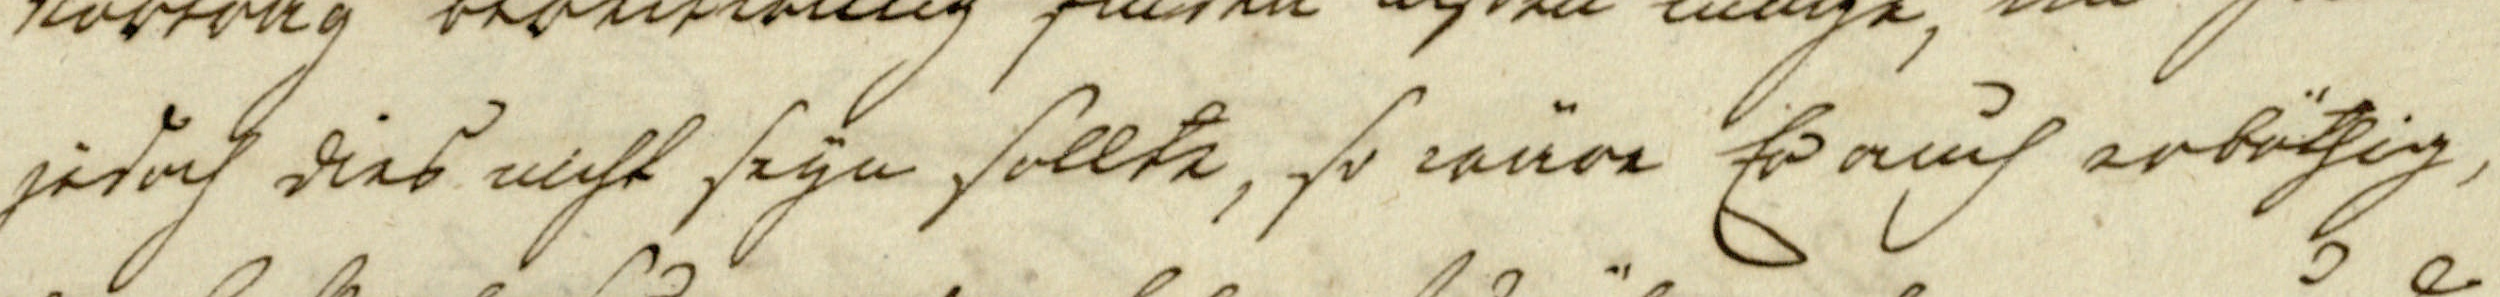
jedoch dies nicht sein sollte, so wäre Er auch erböthig,
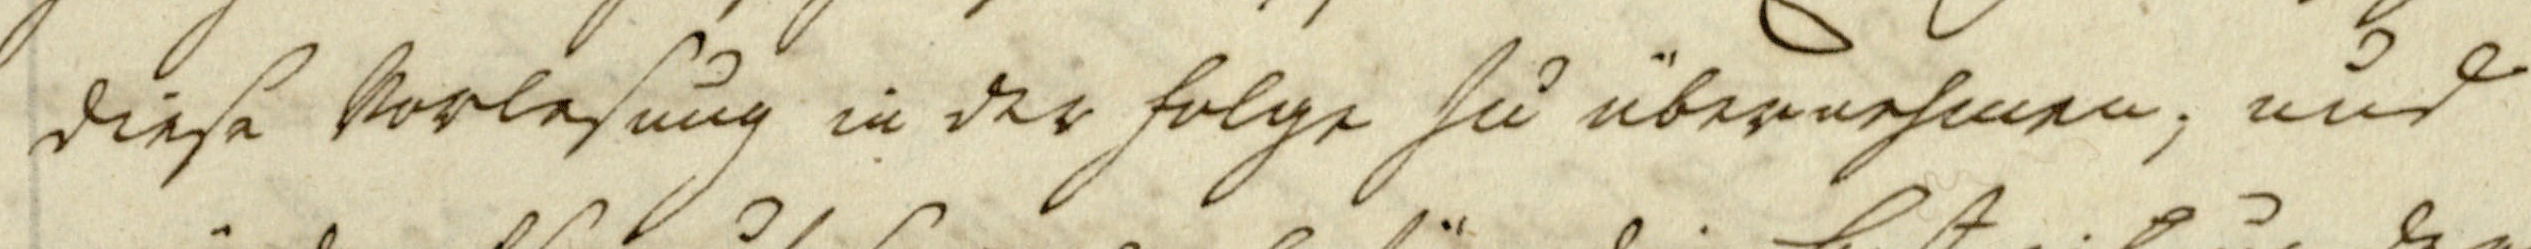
diese Vorlesung in der Folge zu übernehmen, und
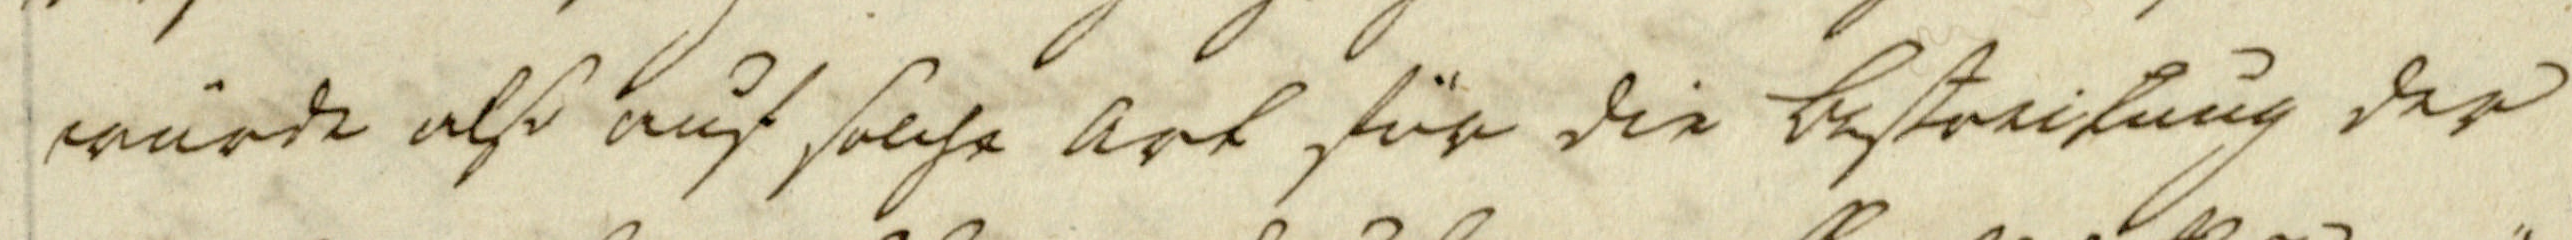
würde also auf solche Art für die Bestreitung der
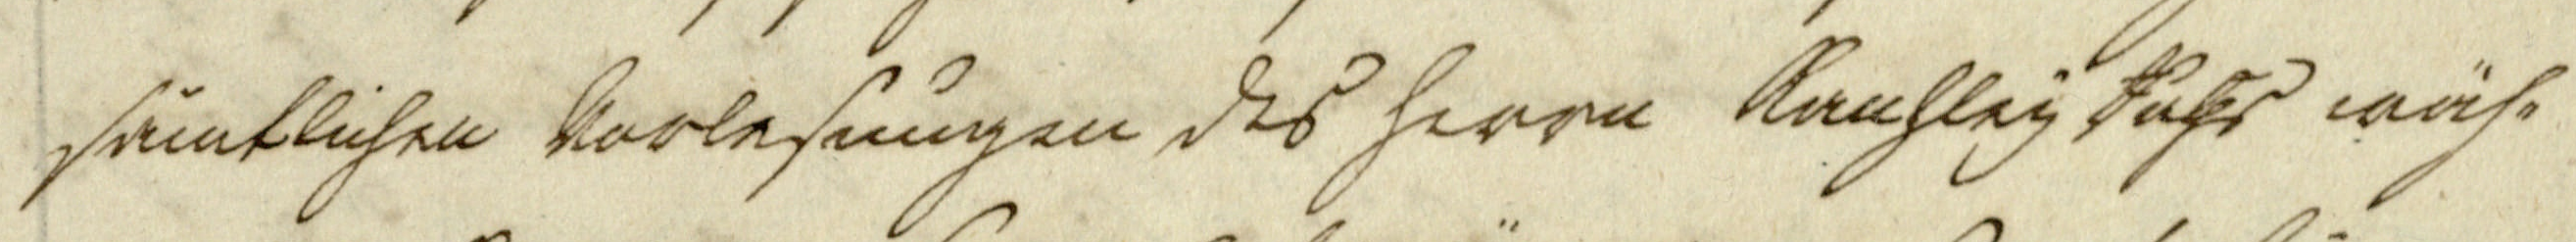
sämtlichen Vorlesungen des herrn Kanzleÿ Raths wäh¬
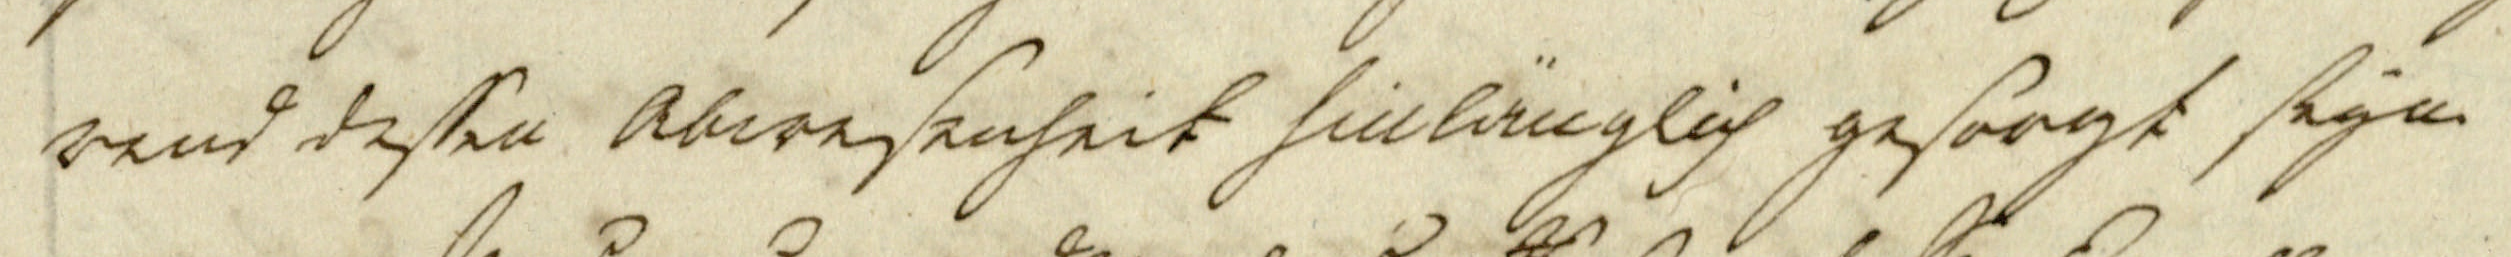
rend dessen Abwesenheit hinlänglich gesorgt seÿn.
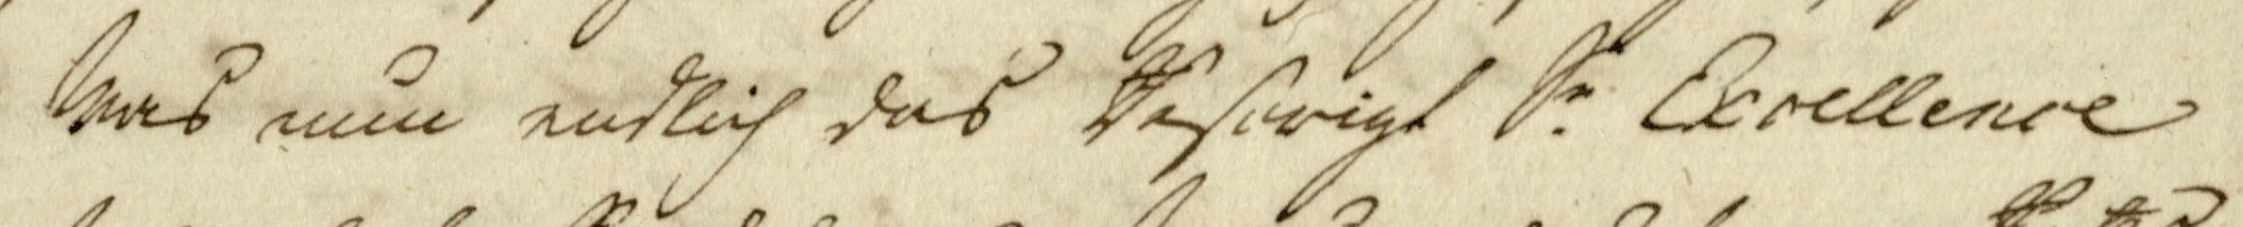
Was nun endlich das Rescript Sr. Excellence
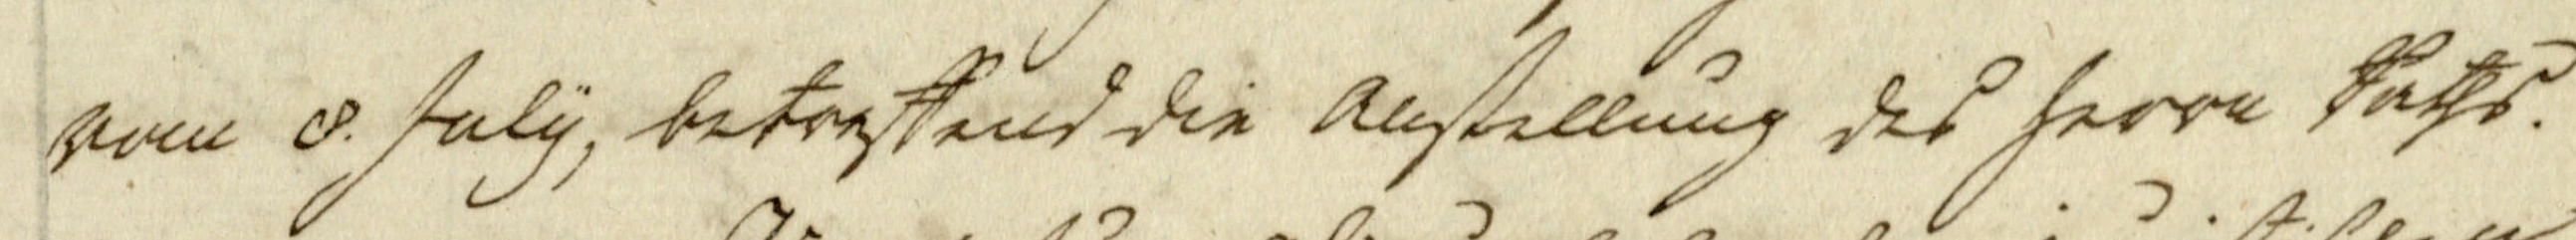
vom 8. Julÿ, betreffend die Anstellung des herrn Raths¬
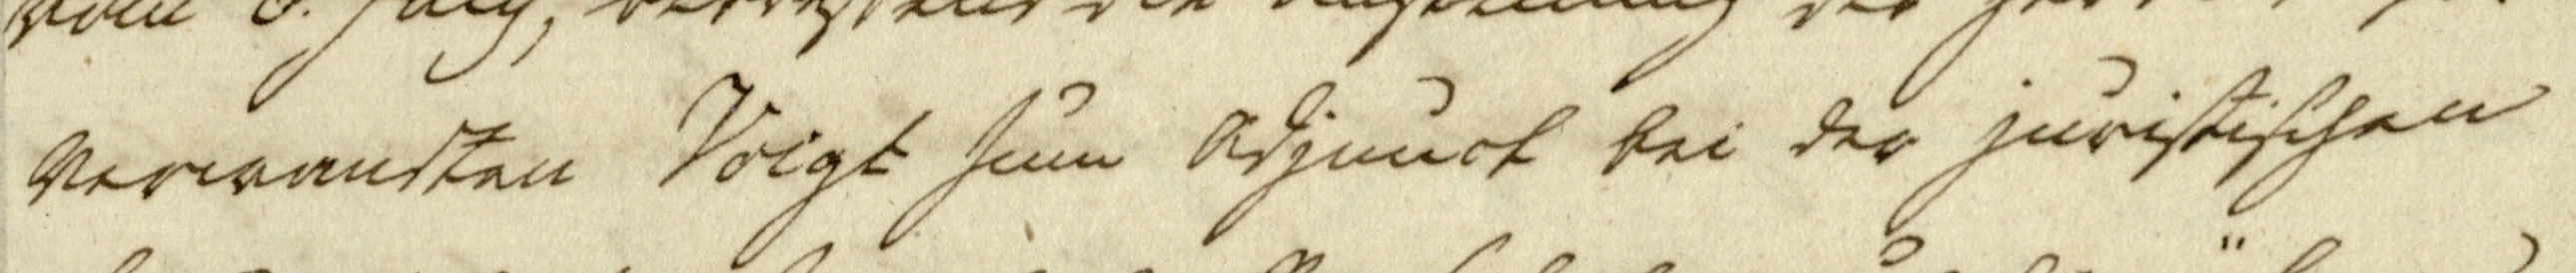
verwandten Voigt zum Adjunct bei der juristischen
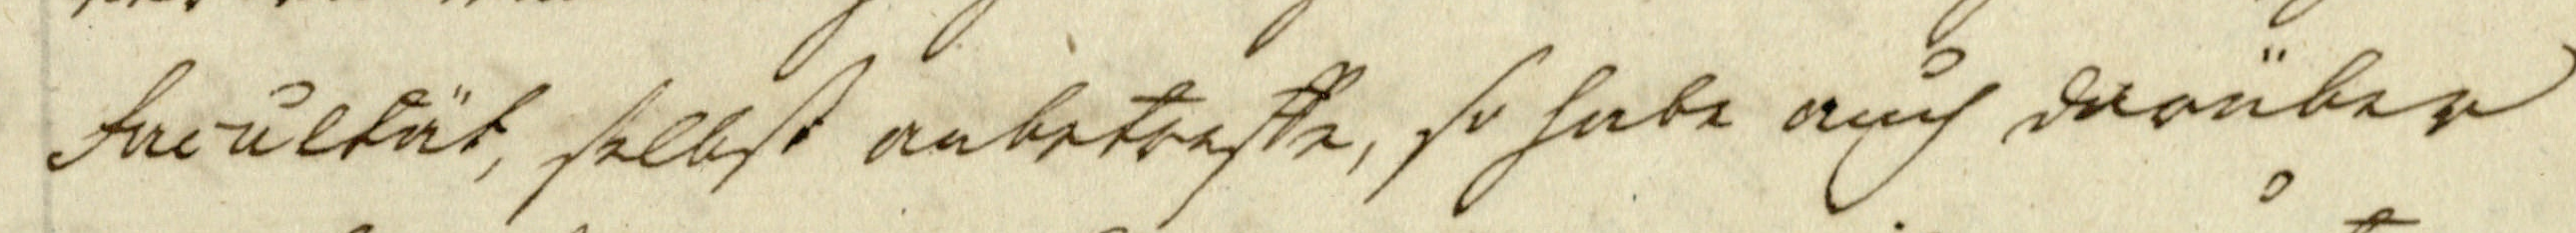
Facultät, selbst anbetreffe, so habe auch darüber
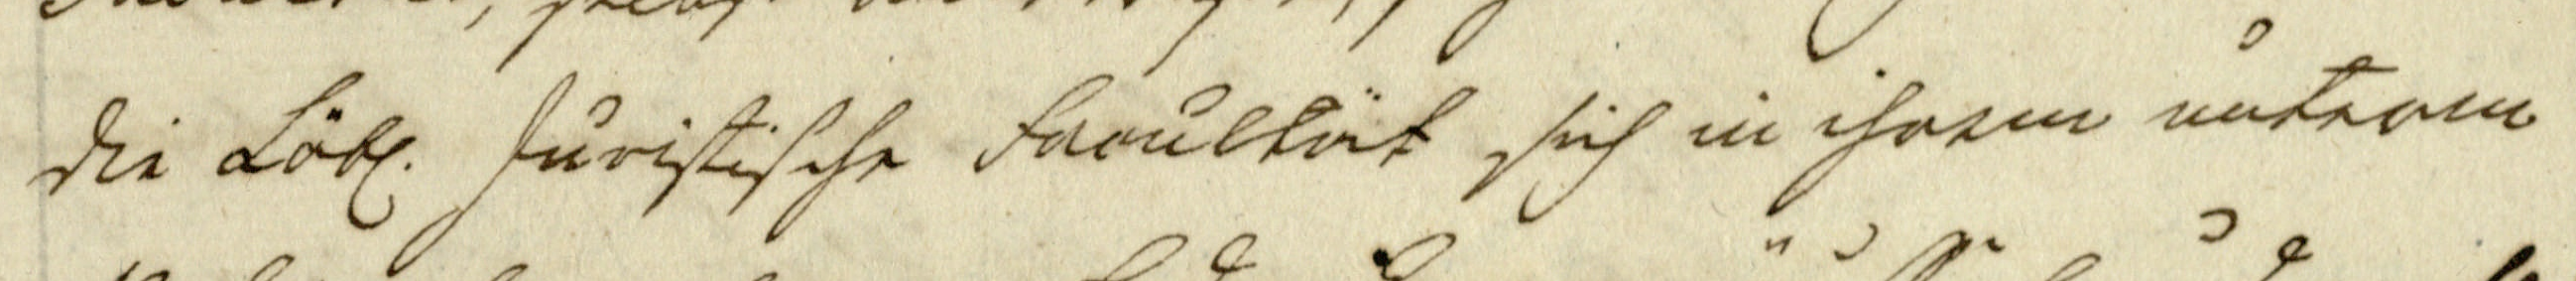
die Löbl. Juristische Facultät sich in ihrem unterm
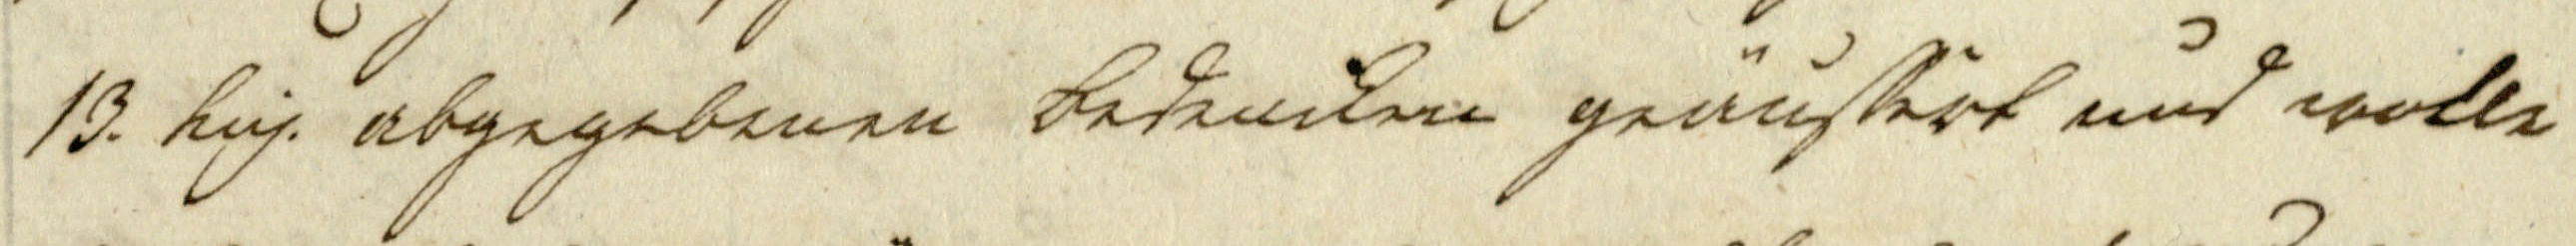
13. huj. abgegebenen Bedencken geäussert und wolle
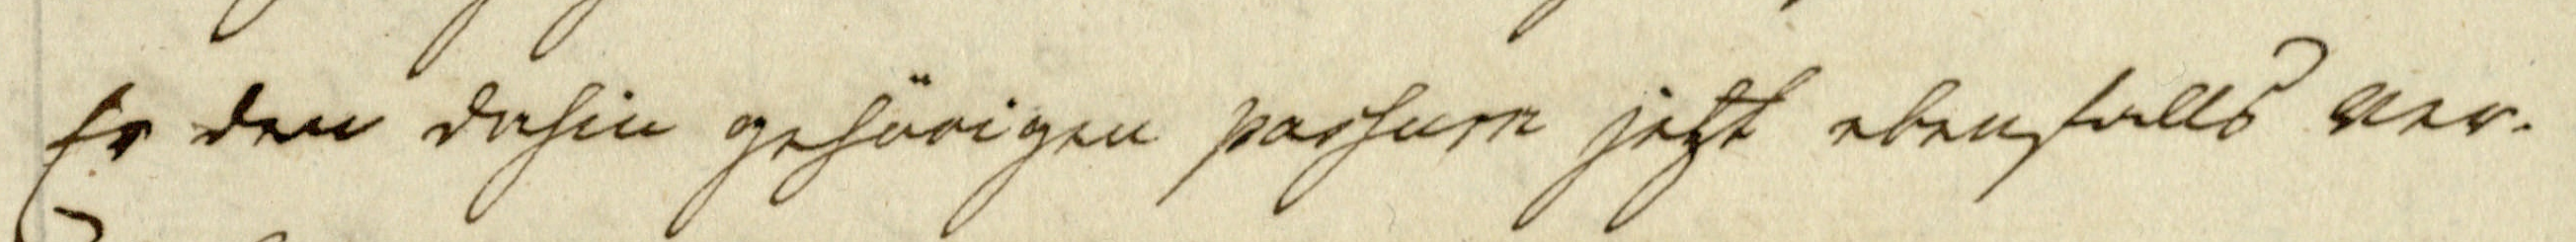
Er den dahin gehörigen passum jetzt ebenfalls ver¬
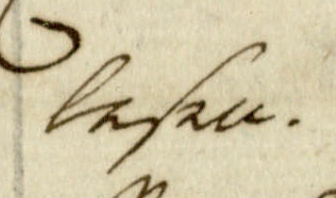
lesen.
